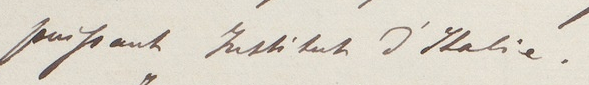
puissant Institut d'Italie.
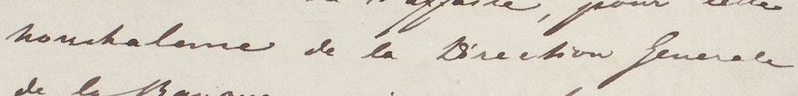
nonchalance de la Direction Generale
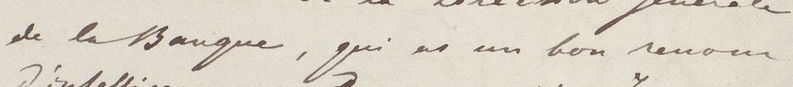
de la Banque, qui as un bon renom
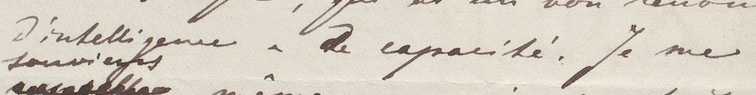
d'intelligence & de capacité. Je me
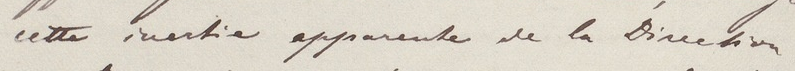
cette inertie apparente de la Direction.
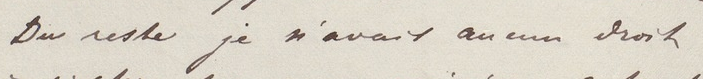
Du reste je n'avait aucun droit
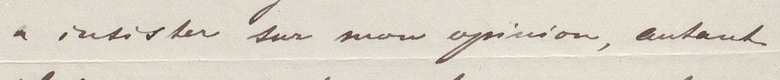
a insister sur mon opinion, autant
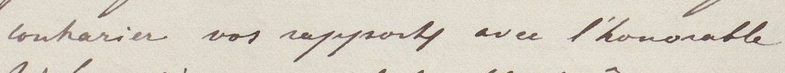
contrarier vos rapports avec l'honorable
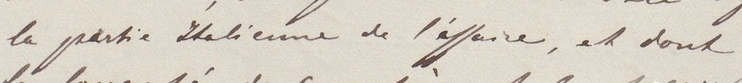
la partie Italienne de l'affaire et dont
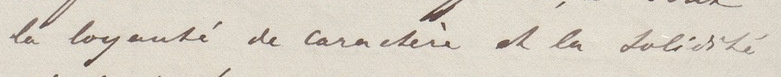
la loyauté de caractère de la solidité
